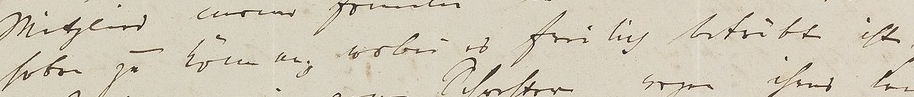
haben zu können; wobei es freilich betrübt ist,
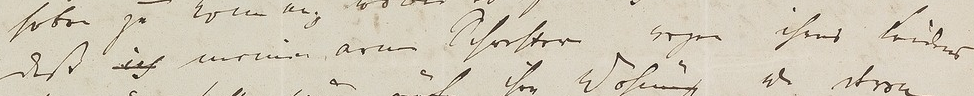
daß ichmeine arme Schwester wegen ihres Leidens
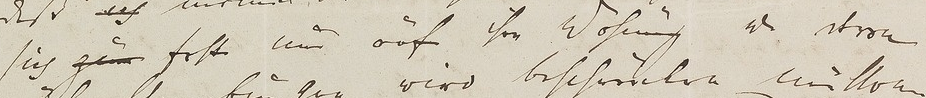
sich zum fast nur auf ihre Wohnung u. deren
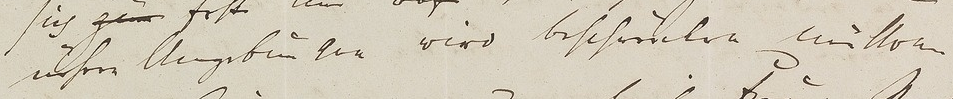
nähere Umgebungen wird beschränken müssen.
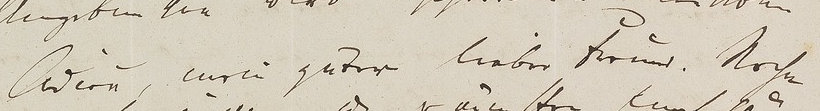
Adieu, mein guter lieber Freund. Noch-
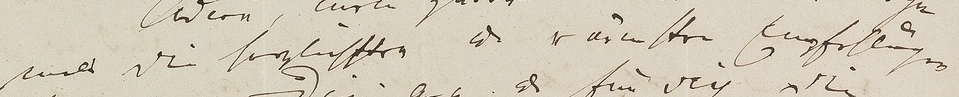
mals die herzlichsten u. wärmsten Empfehlungen
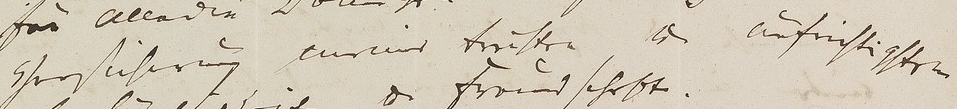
Versicherung meiner treusten u. aufrichtigsten
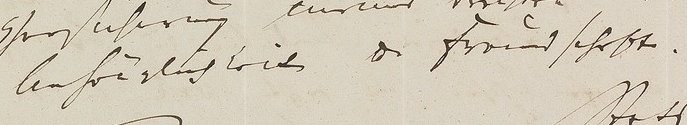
Anhänglichkeit u. Freundschaft.
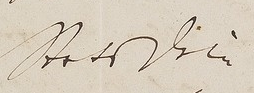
Stets Dein
